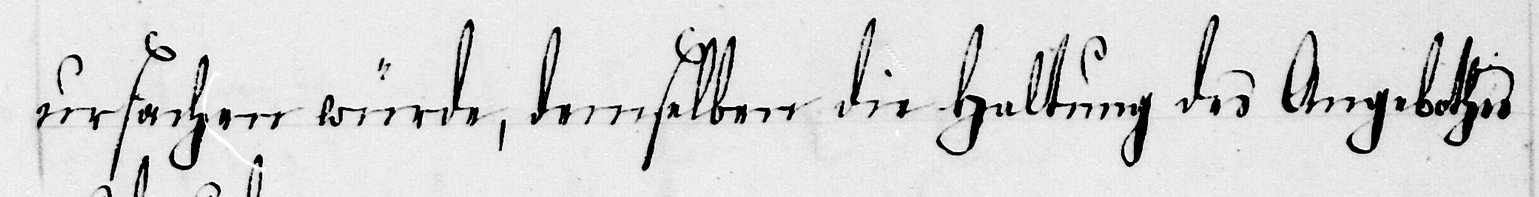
ursachen würde, demselben die Haltung des Angebothes
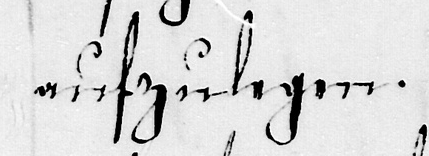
aufzulegen.
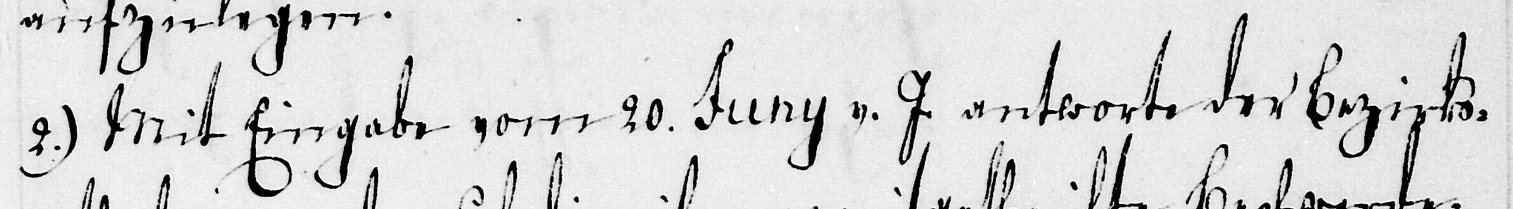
2.) Mit Eingabe vom 20. Juny v. J. antworte der Bezirks¬
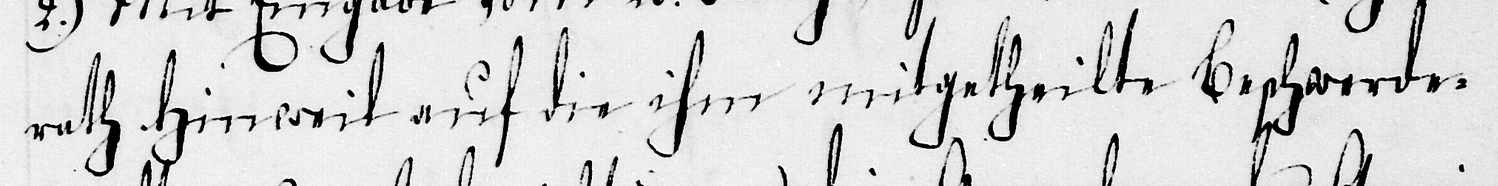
rath Hinweil auf die ihm mitgetheilte Beschwerde¬
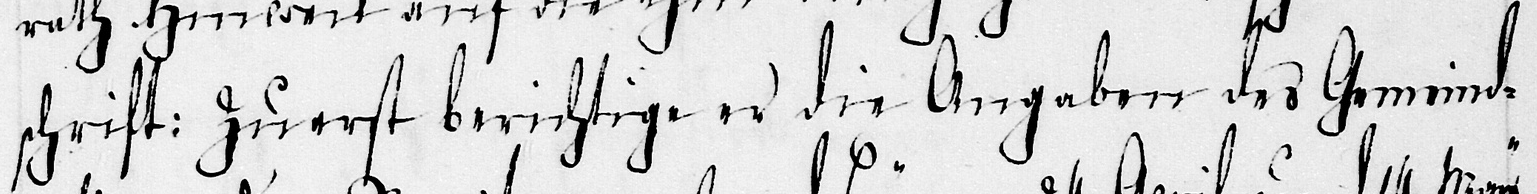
schrift: Zuerst berichtige er die Angaben des Gemeind¬
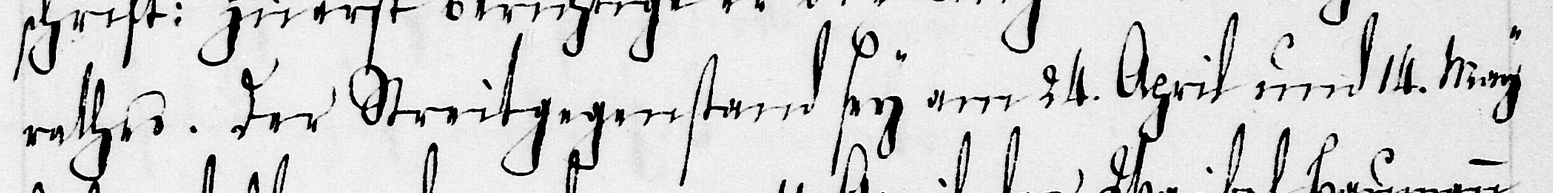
rathes. Der Streitgegenstand sey am 24. April und 14. May
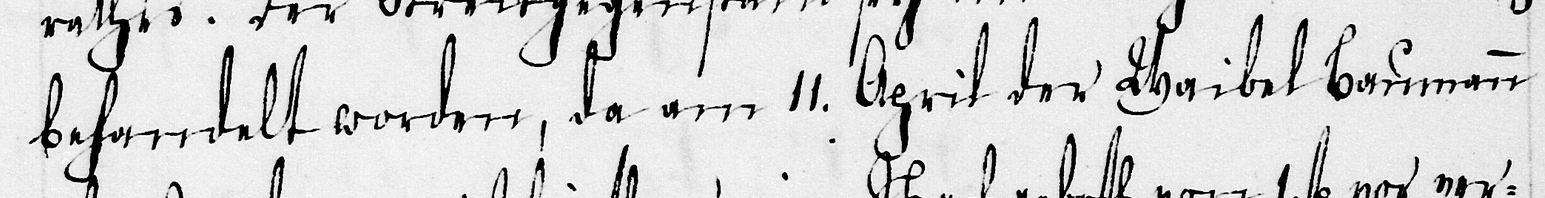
behandelt worden, da am 11. April der Waibel Baumann
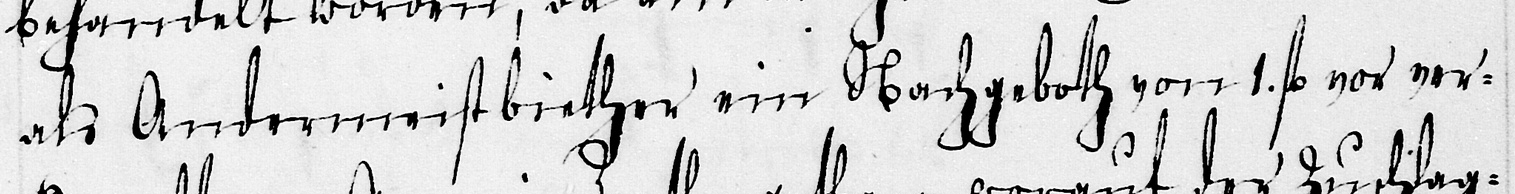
als Andermeistbiether ein Nachgeboth von 1. fl. vor ver¬
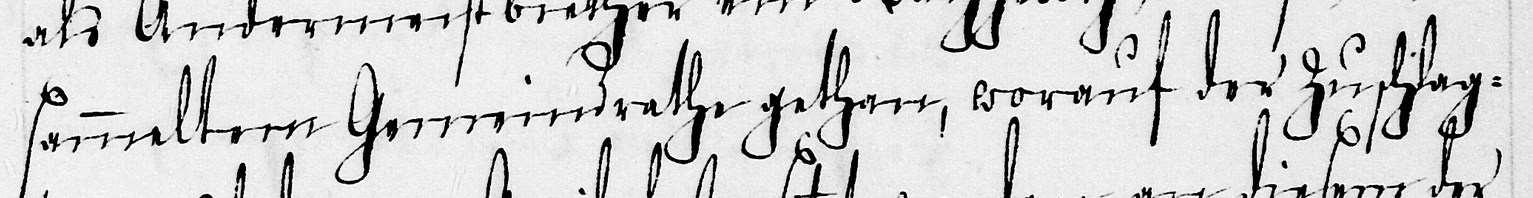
sammeltem Gemeindrathe gethan, worauf der Zuschlag¬
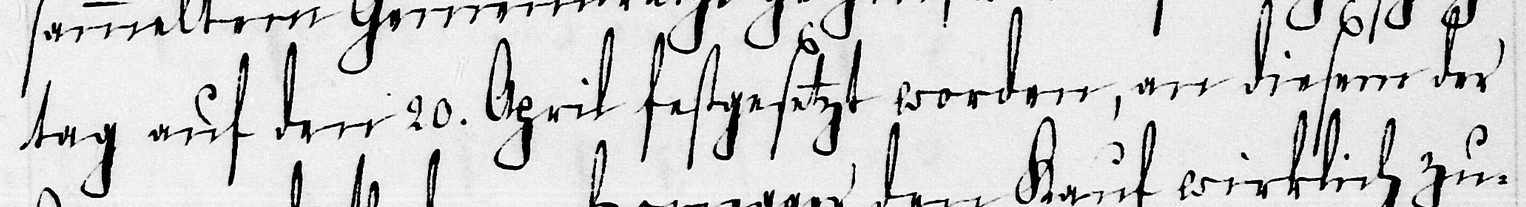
tag auf den 20. April festgesetzt worden, an diesem der
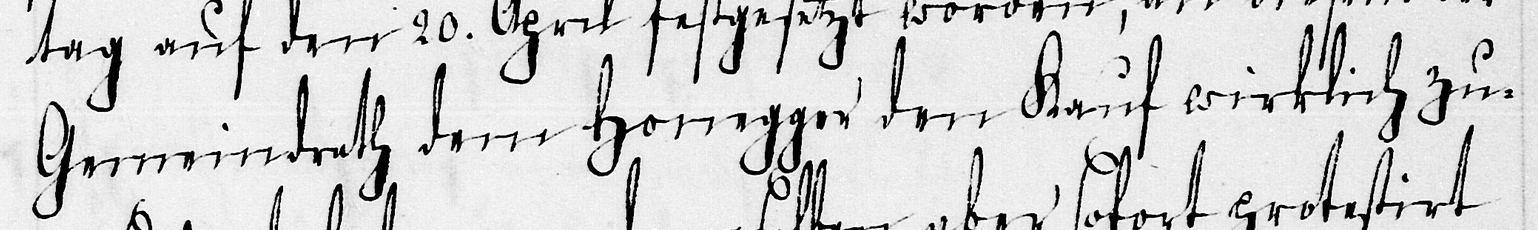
Gemeindrath dem Honegger den Kauf wirklich zu¬
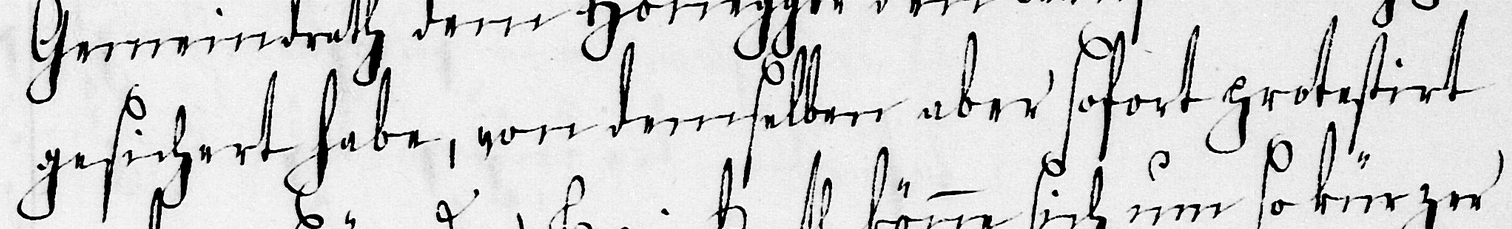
gesichert habe, von demselben aber sofort protestirt
